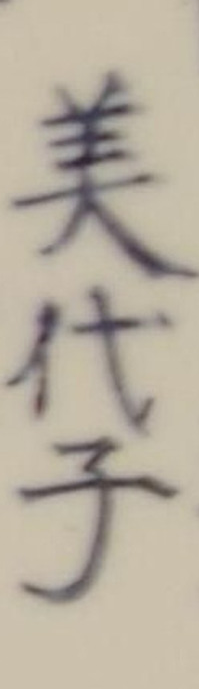美代子
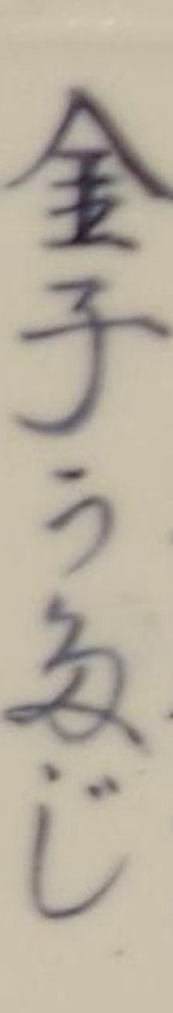金子かたじ
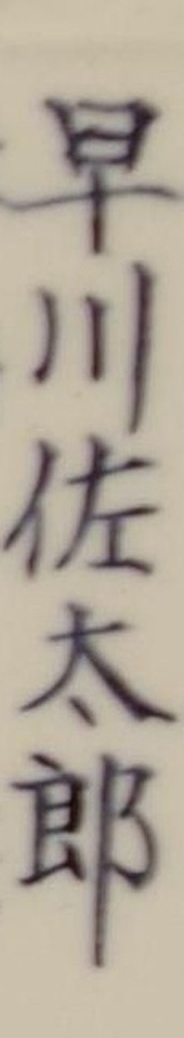早川佐太郎
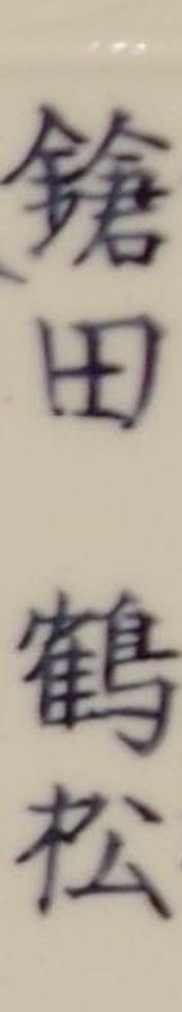鎗田鶴松
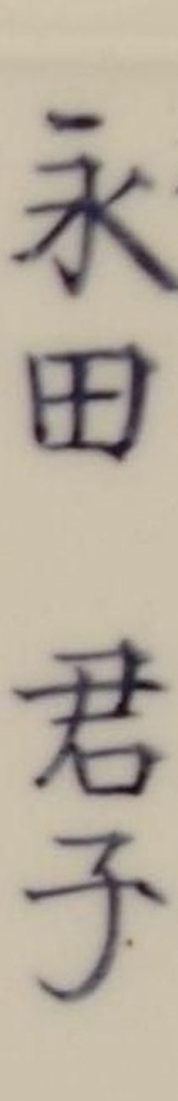永田君子
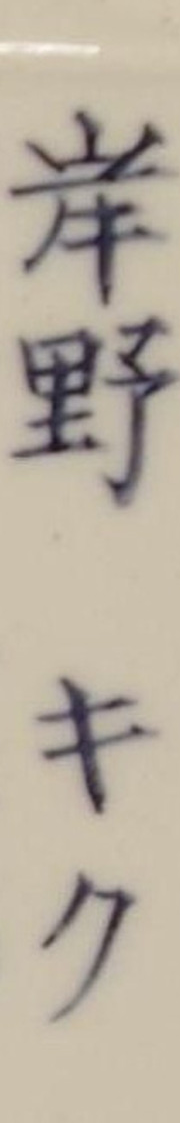岸野キク
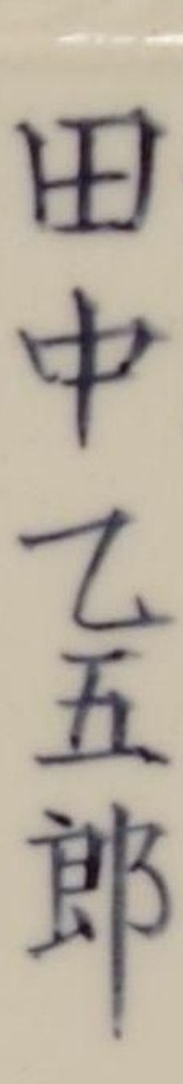田中乙五郎
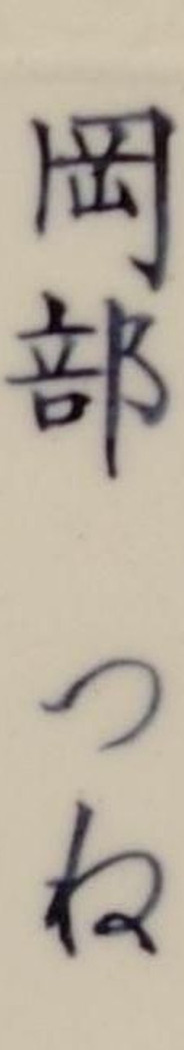岡部つね
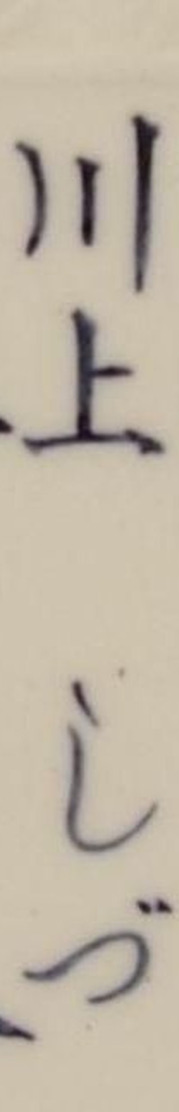川上しづ
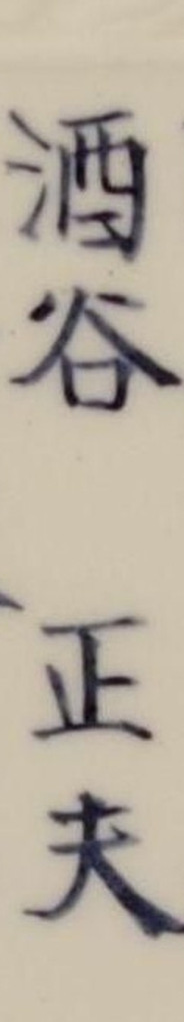酒谷正夫
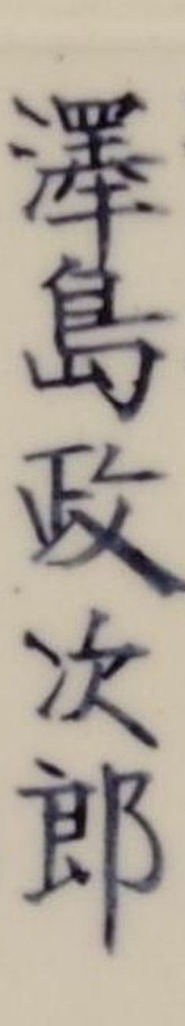澤島政次郎
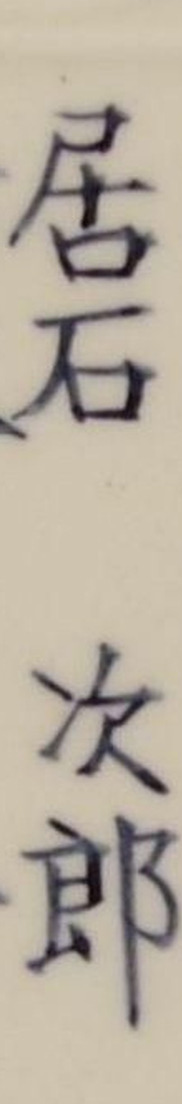居石次郎
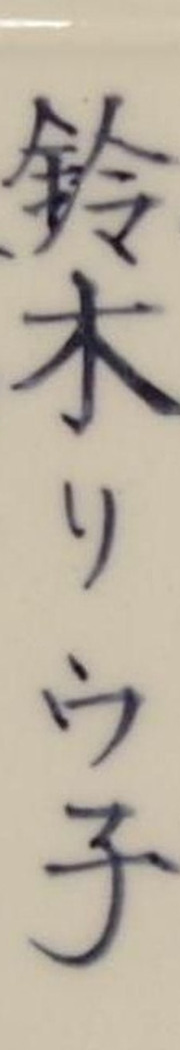鈴木リウ子
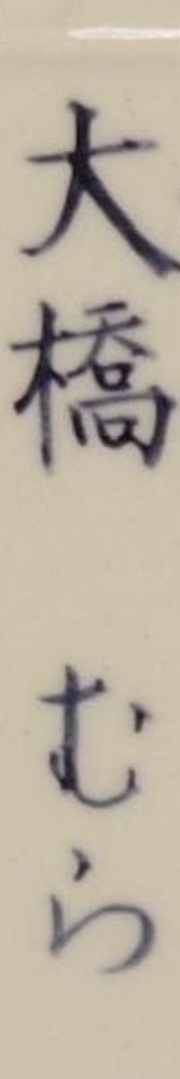大橋むら
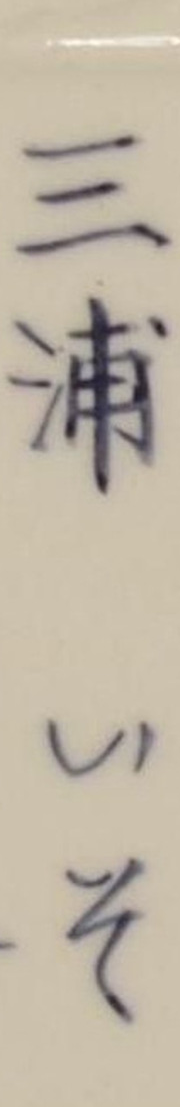三浦いそ
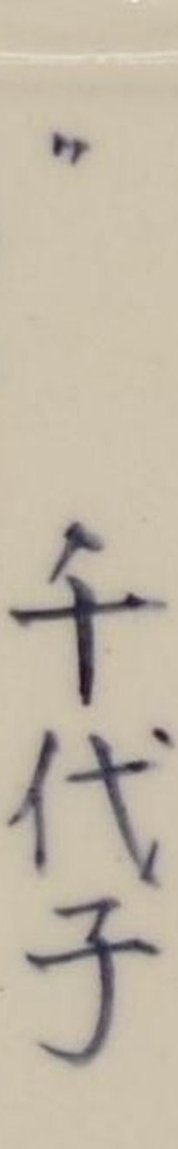千代子
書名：M~S
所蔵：高野山金剛峯寺
